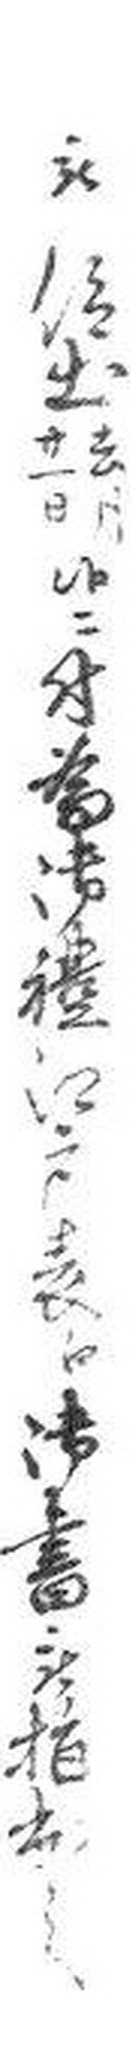廿一日候ニ付為御礼江戸表江御書被指出之
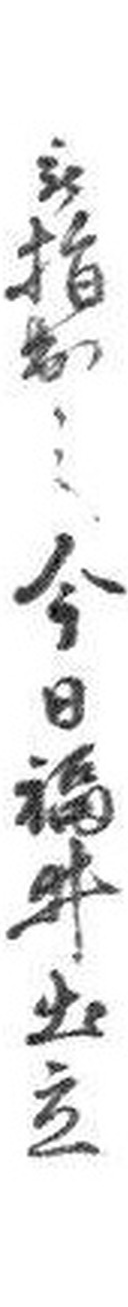被指出之今日福井出立
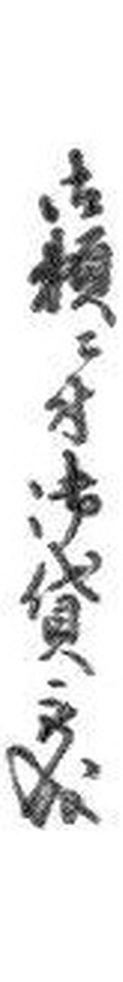御頼ニ付御貸被成
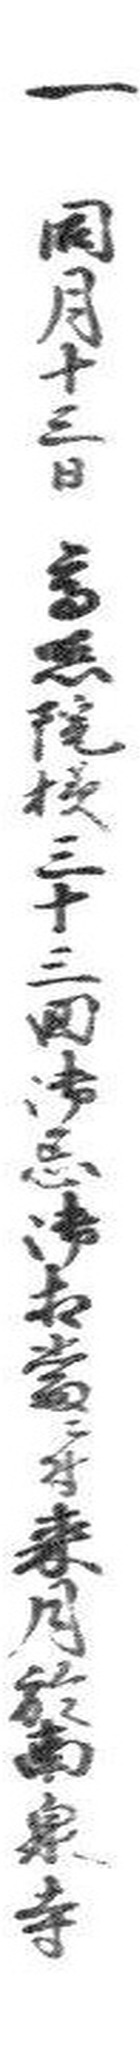一同月十三日高照院様三十三回御忌御相当ニ付来月於南泉寺
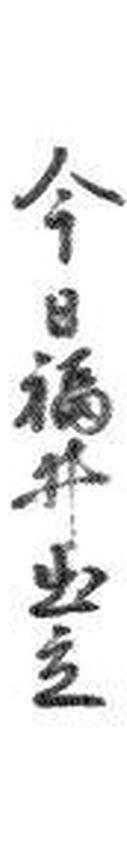今日福井出立
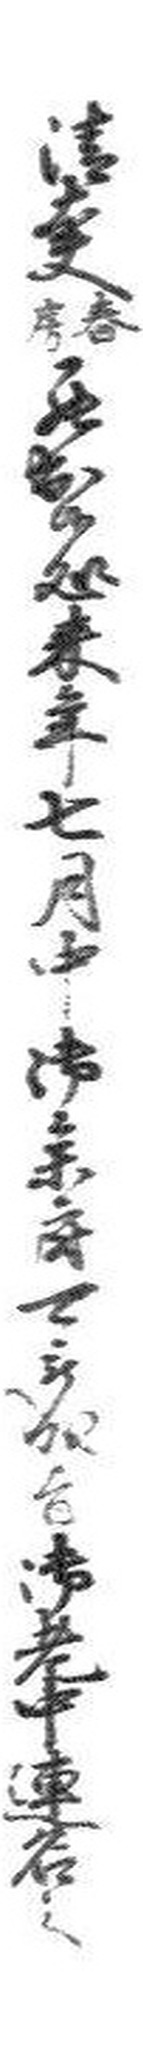房罷出候処来年七月中御参府可被成旨御老中連名之
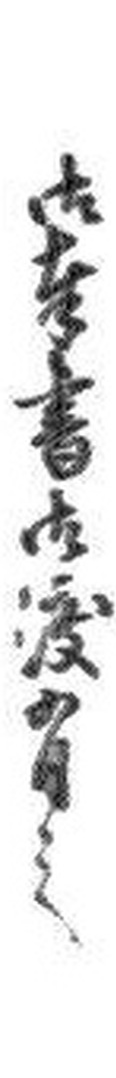御奉書御渡有之
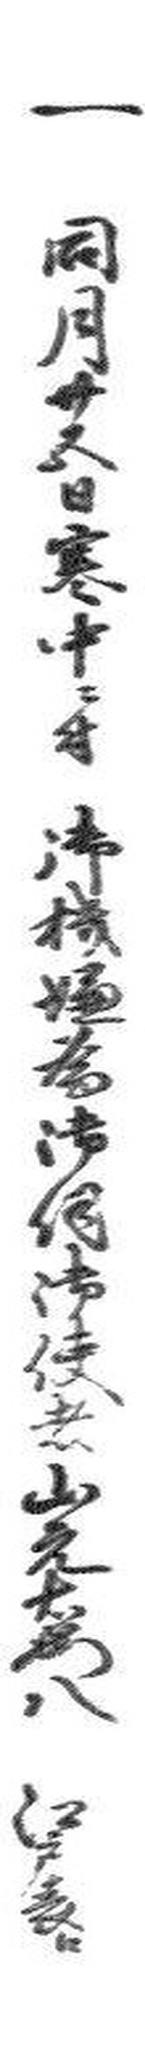一同月廿五日寒中ニ付御機嫌為御伺御使者山元右衛門八江戸表江

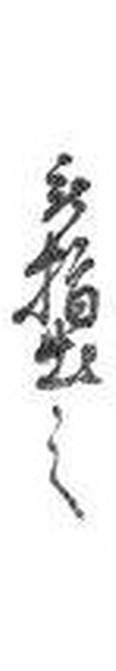被指出之
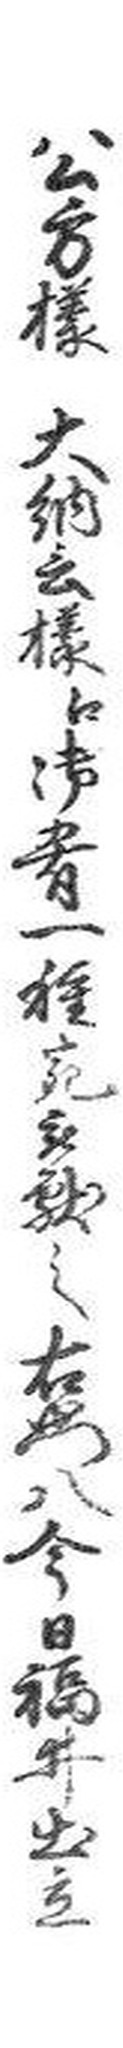公方様大納言様江御肴一種宛被献之右衛門八今日福井出立
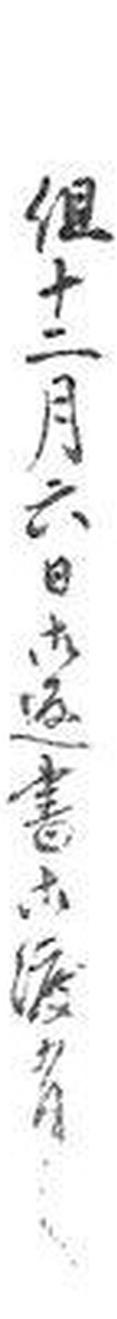但十二月六日御返書御渡有之
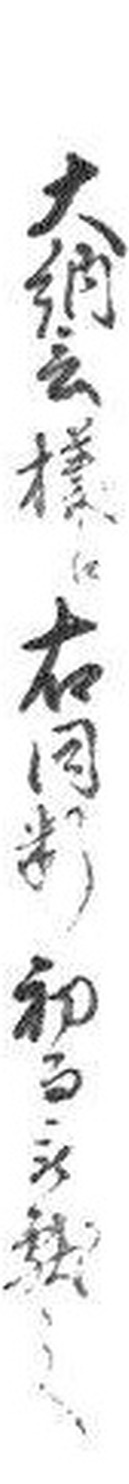大納言様江右同断初而被献之
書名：家譜 二十三 吉品公 従宝永元年到同二年
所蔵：福井県文書館 Fukui Prefectural Archives
